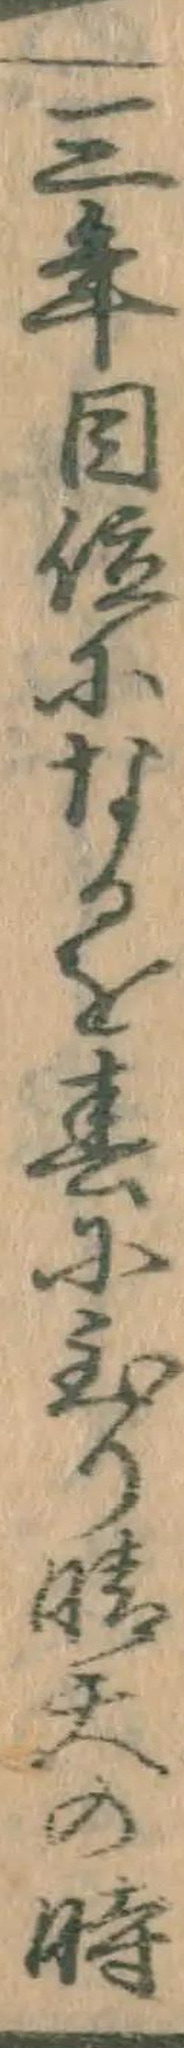三年目位になるを春に至り晴天の時
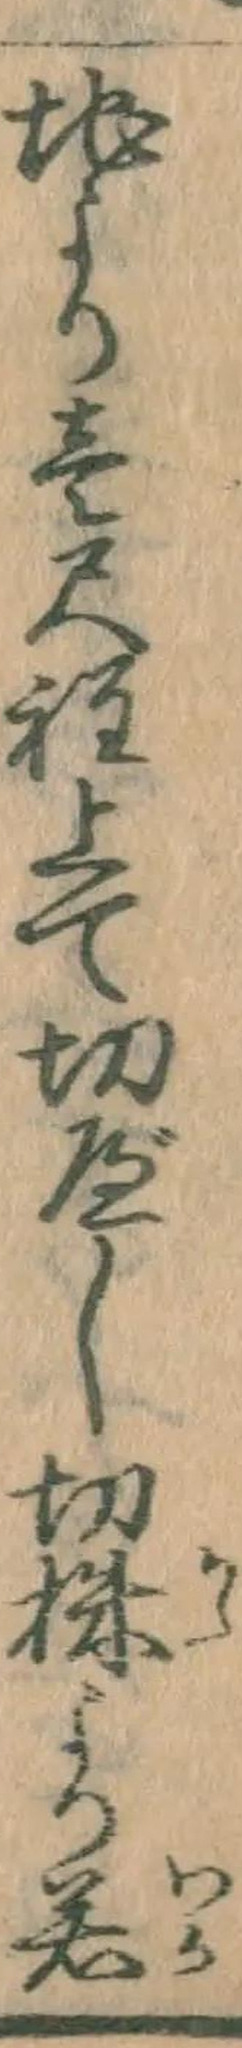地より壱尺程上て切べし切株より若
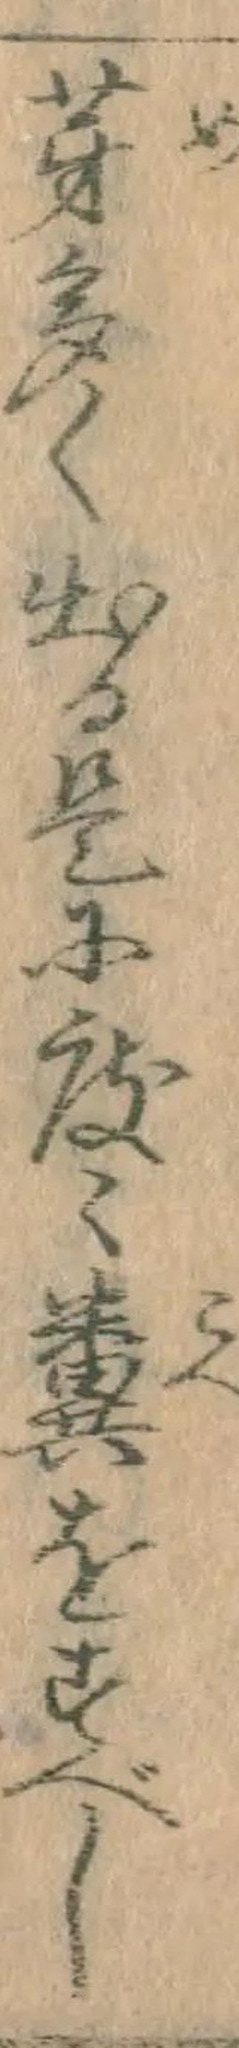芽多く出る是に度々糞をすべし
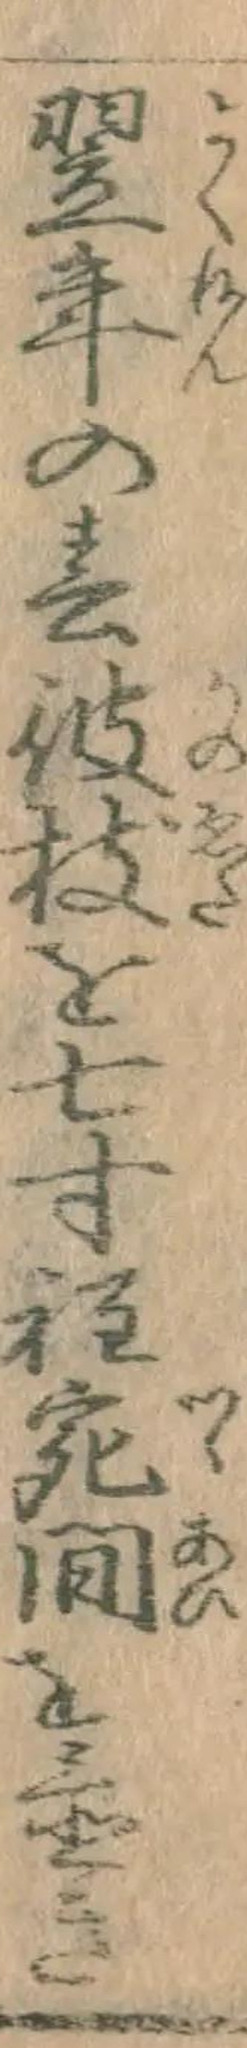翌年の春彼枝を七寸程宛間を置き
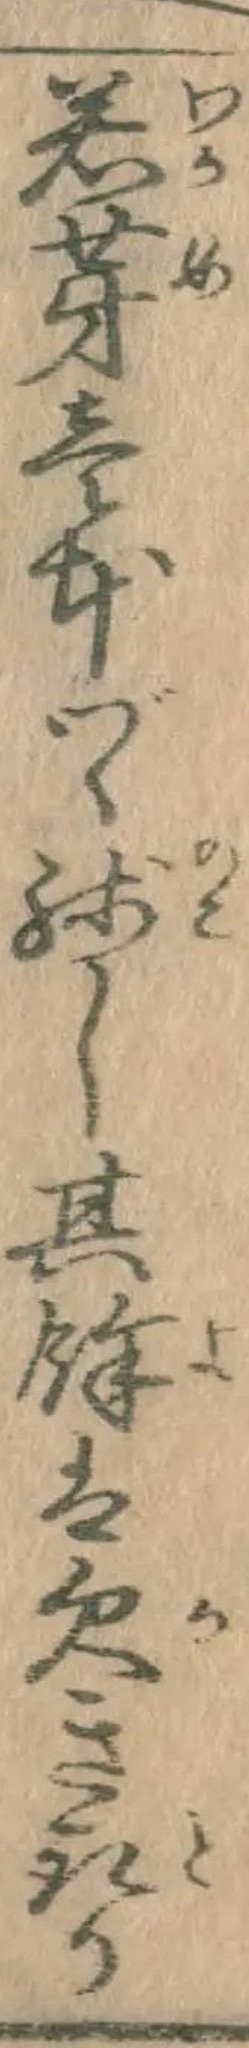若芽壱本づゝ残し其余は欠き取り
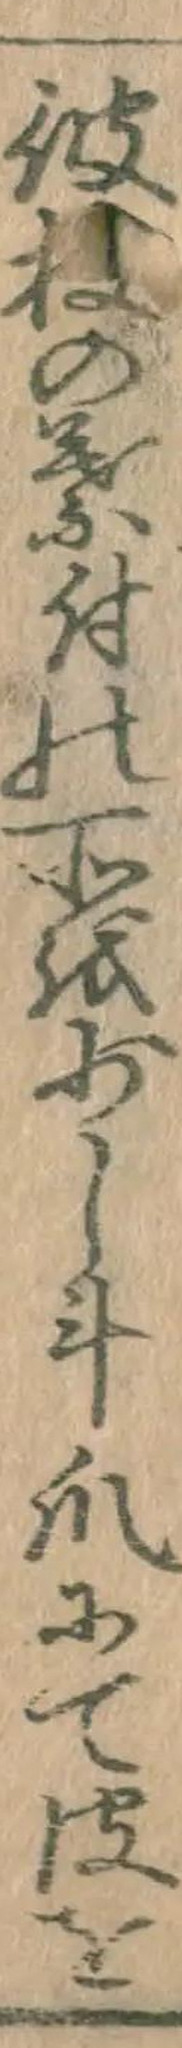彼枝の葉付の所を少し斗爪にて皮を
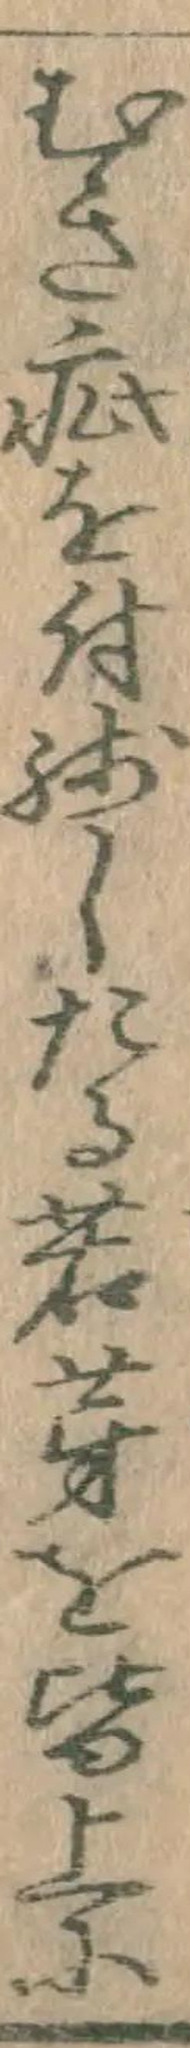むき疵を付残したる若芽を皆上に
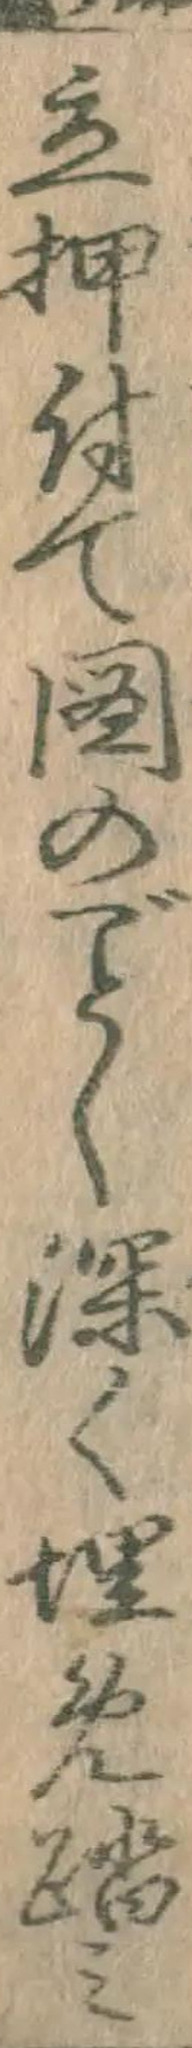立押付て図のごとく深く埋め踏み
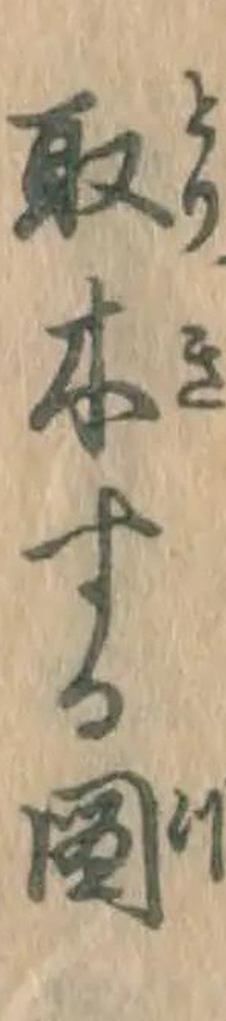取木する図
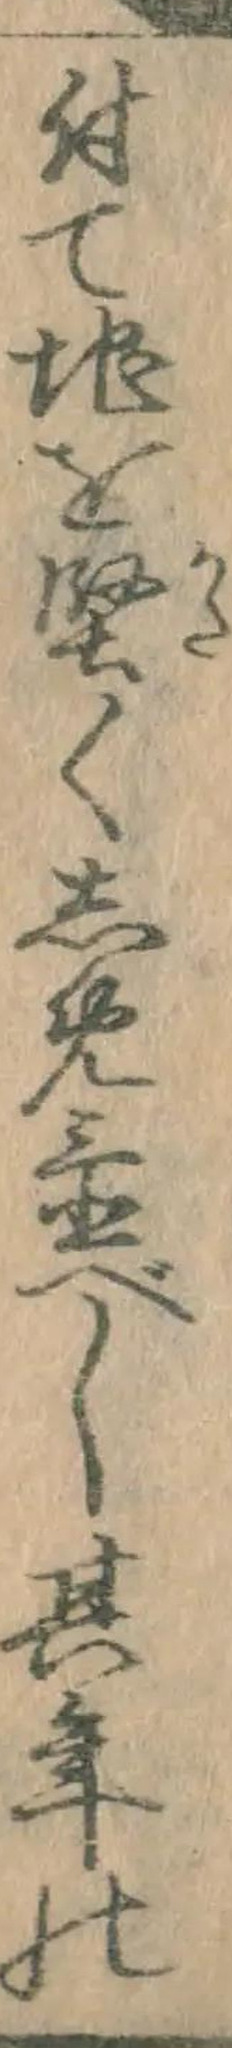付て地を堅くしめ置べし其年の

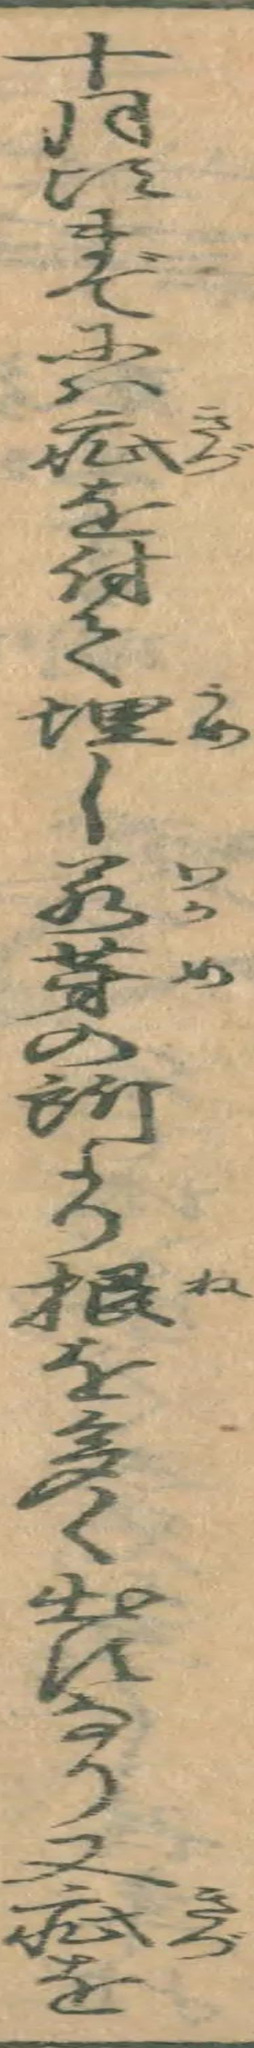十月頃までには疵を付て埋し若芽の所より根を多く出すなり又疵を
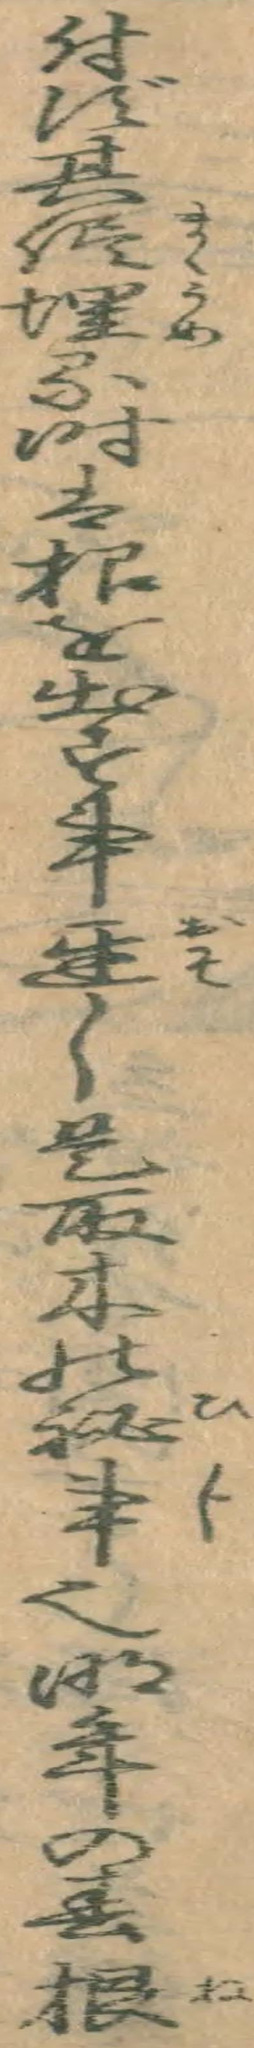付ず其侭埋る時は根を出す事遅し是取木の秘事也明年の春根
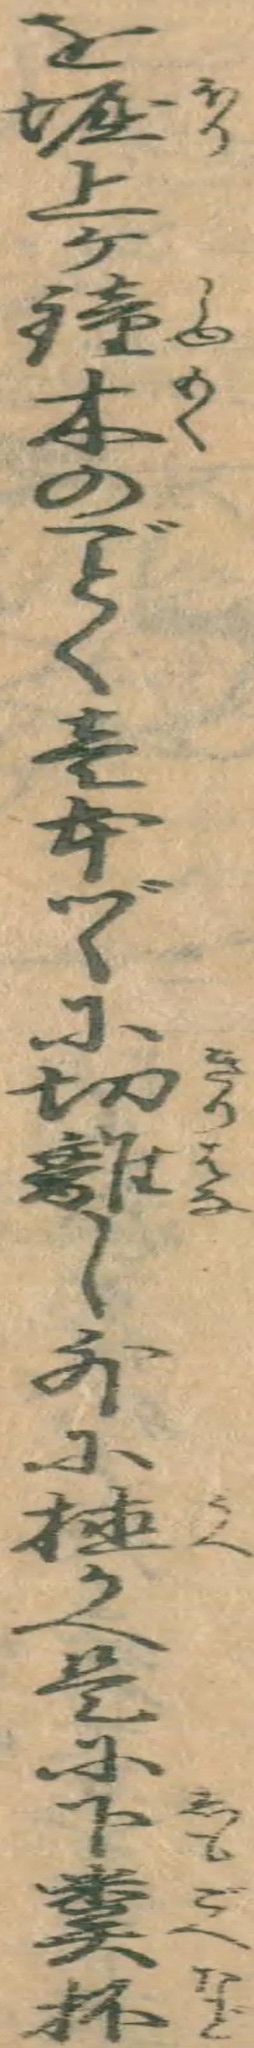を堀上ケ鐘木のごとく壱本ヅヽに切離し外に植かへ是に下糞杯
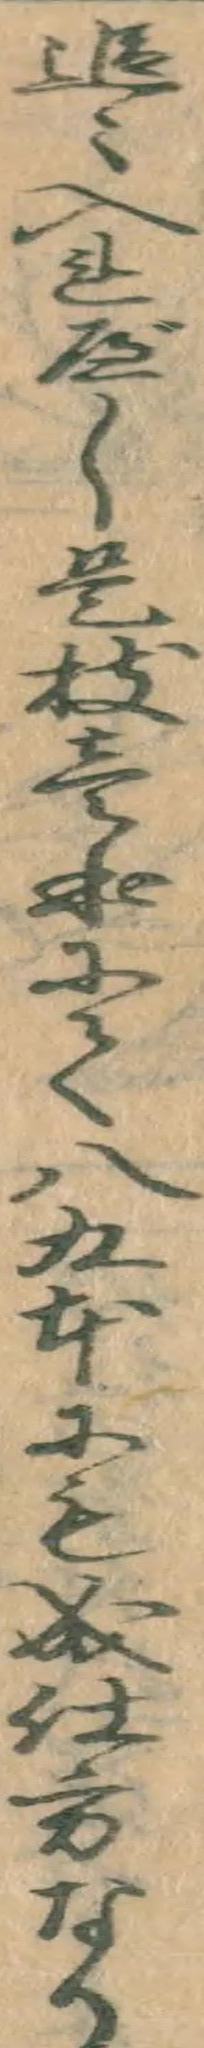追々入れべし是枝壱本にて八九本にも成仕方なり
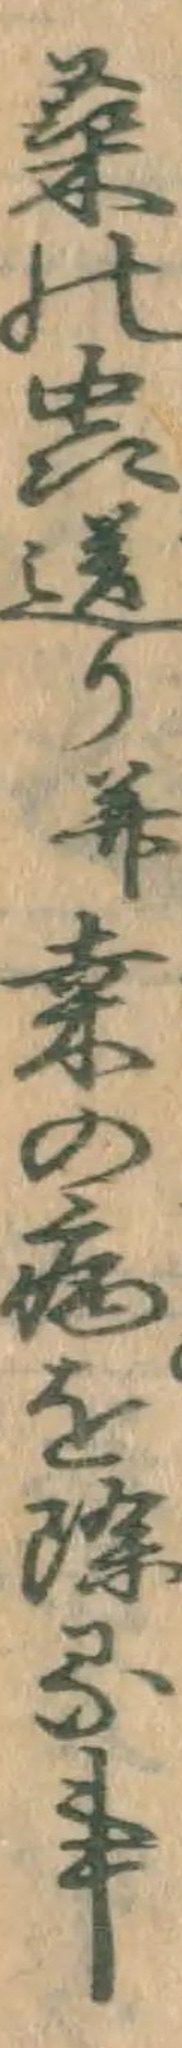桑の虫送り并桑の病を除る事
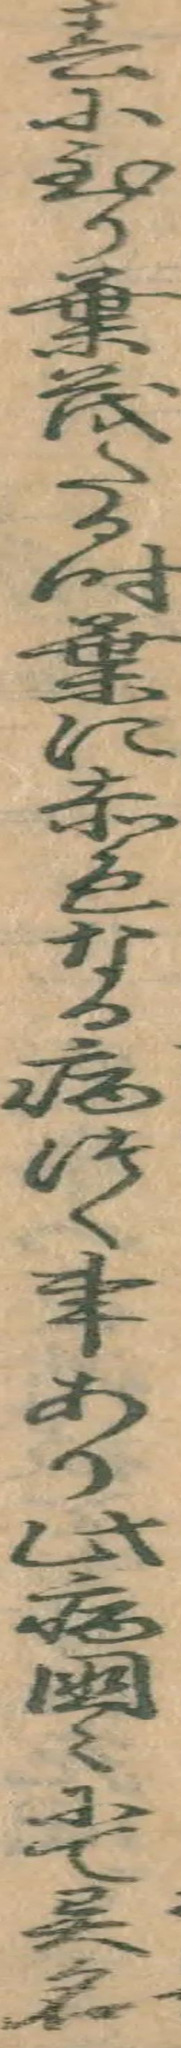春に至り葉茂たる時葉に赤色なる病つく事あり此病国々にて異名
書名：養蚕秘録 3巻. [1]
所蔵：国立国会図書館 National Diet Library, JAPAN
